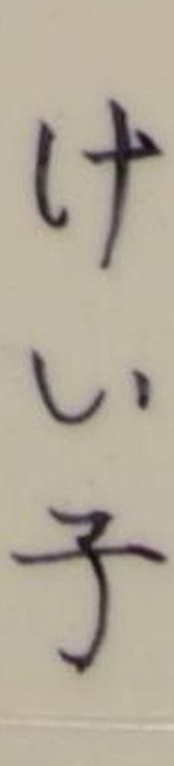けい子
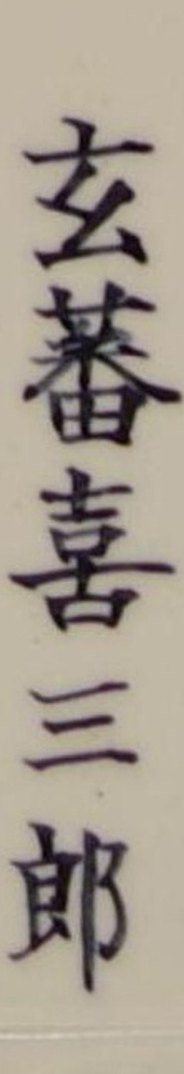玄蕃喜三郎
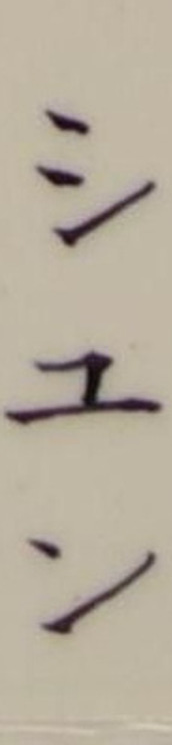シユン
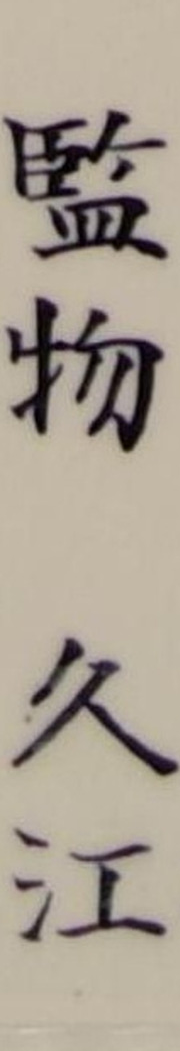監物久江
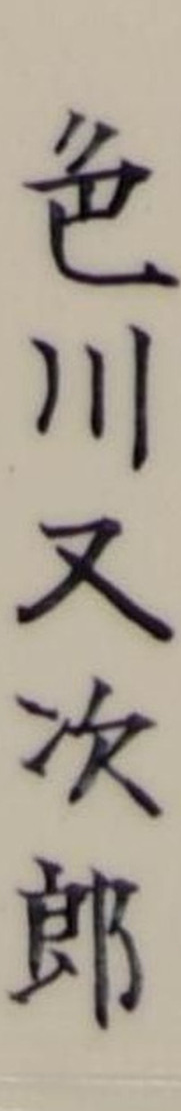色川又次郎
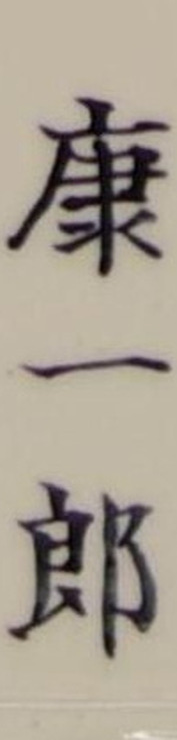康一郎
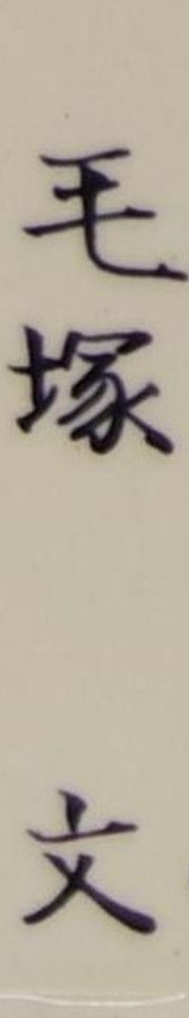毛塚文
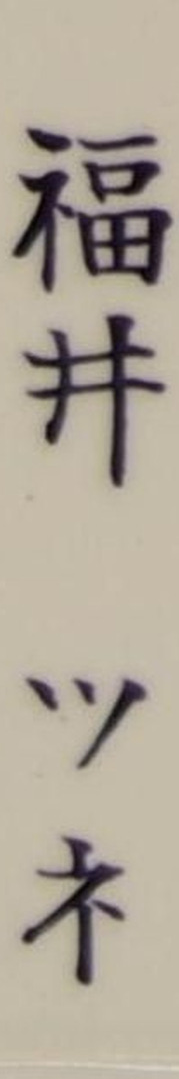福井ツネ

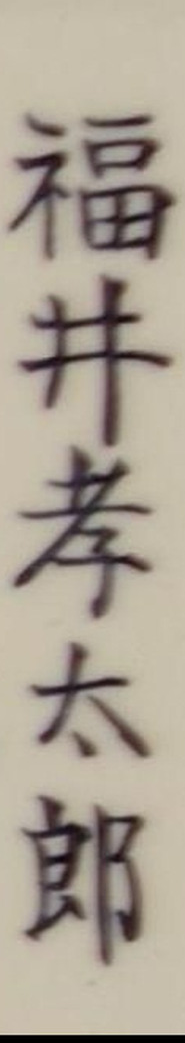福井孝太郎
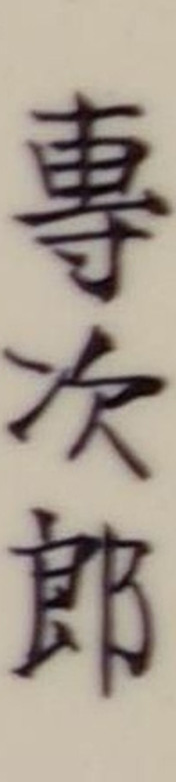専次郎
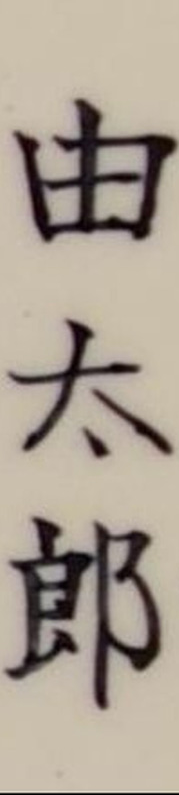由太郎
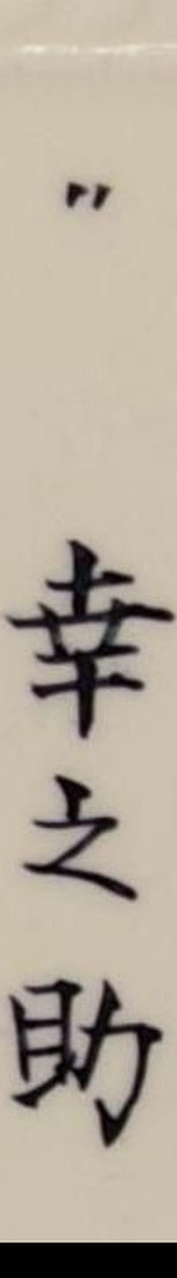幸之助
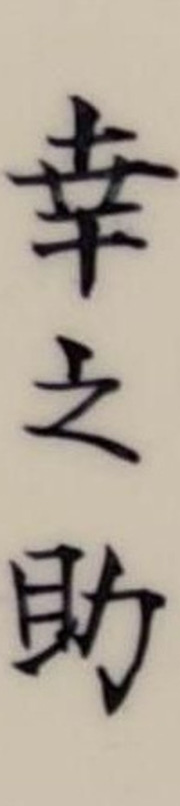幸之助
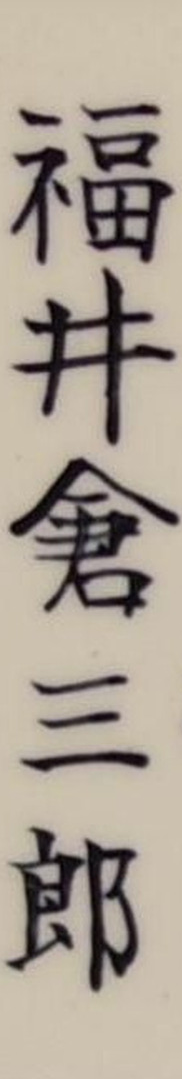福井倉三郎
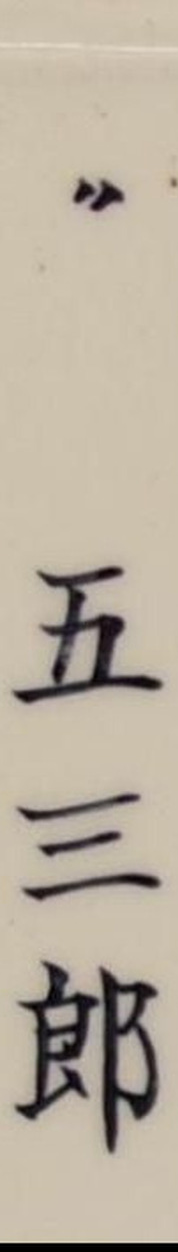五三郎
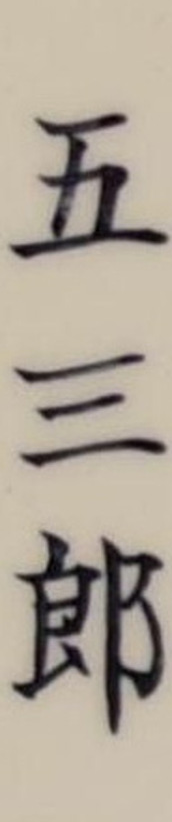五三郎
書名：E~L
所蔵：高野山金剛峯寺
